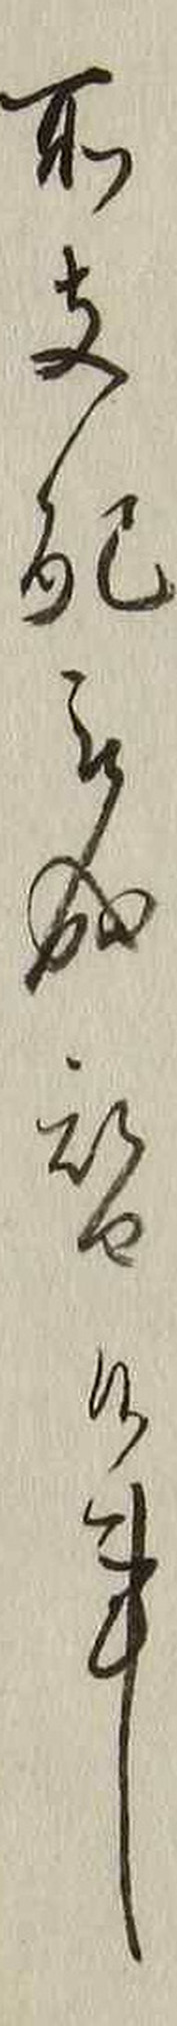所支配被成替候事
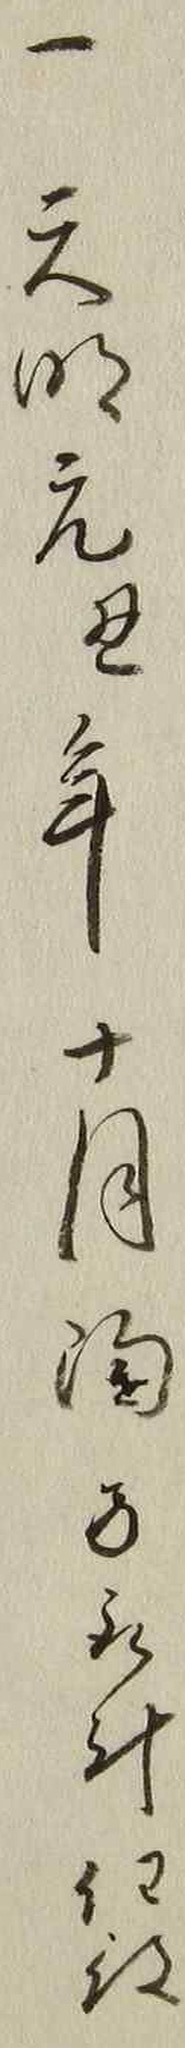一天明元丑年十月陶方取計任役
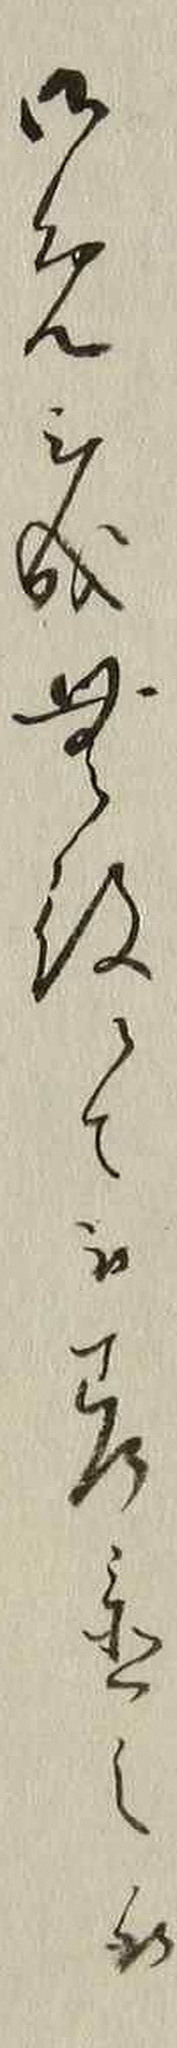御免被成無役ニて被差置之被
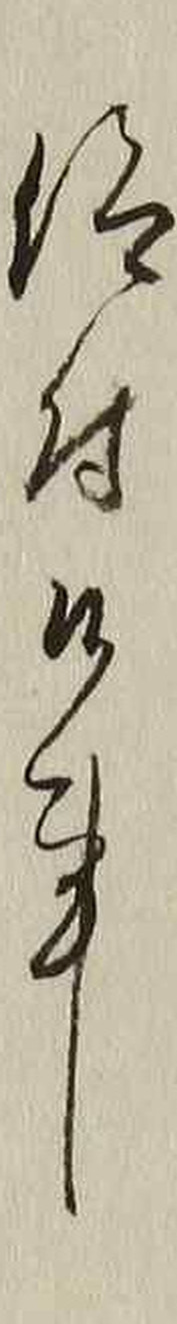仰付候事
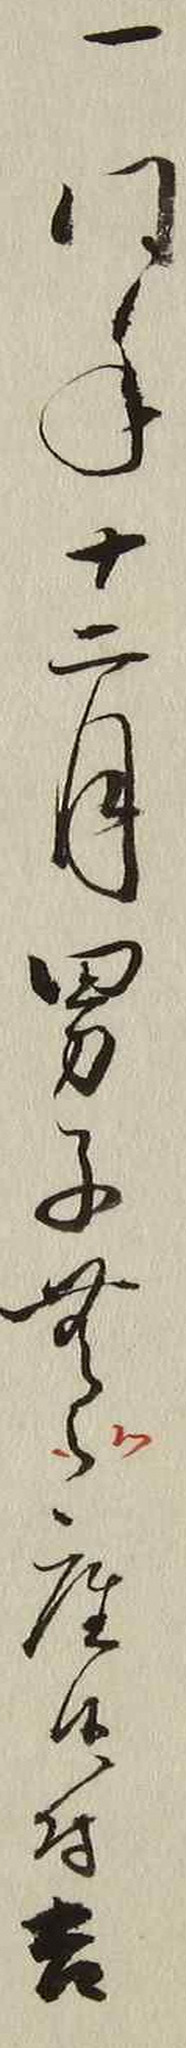一同年十二月男子無御座候ニ付吉
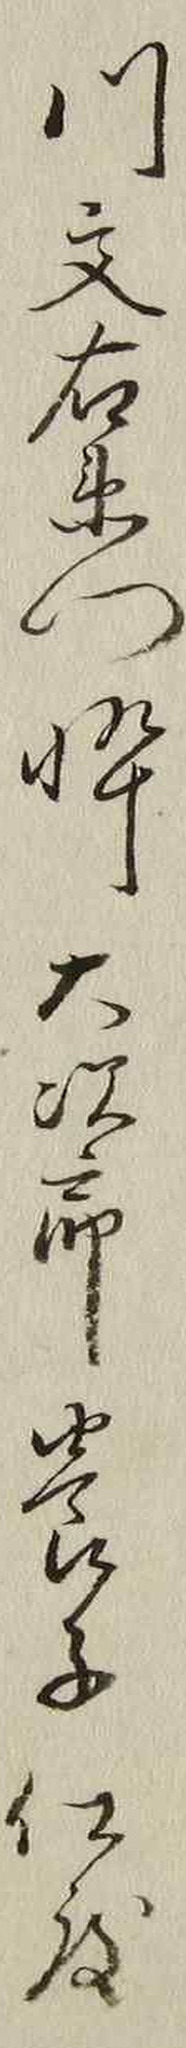川文右衛門倅大次郎養子仕度
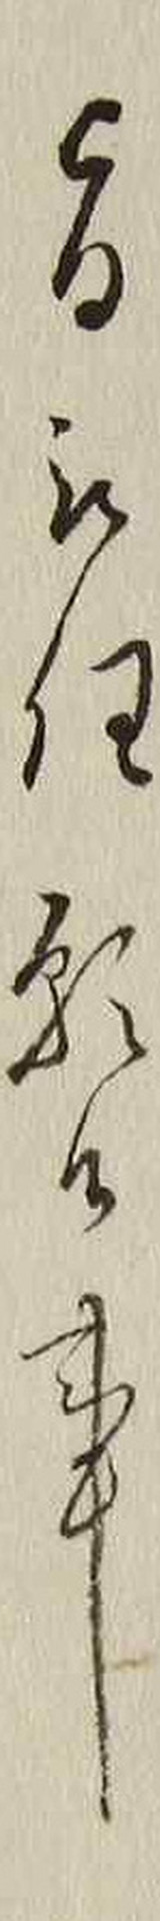旨被任願候事
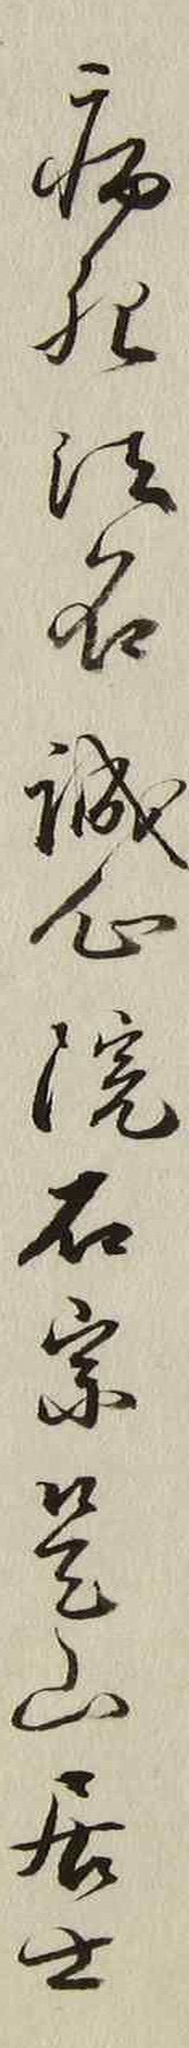病死法名誠心院石宗是山居士
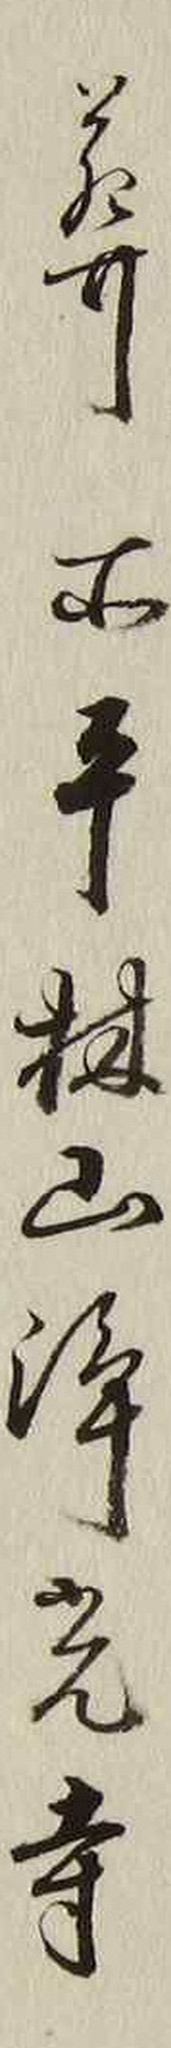葬所平林山浄光寺

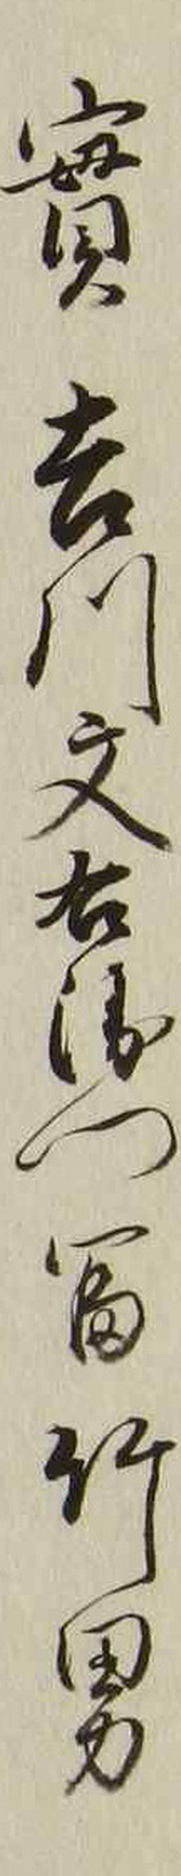実吉川文右衛門冨竹男
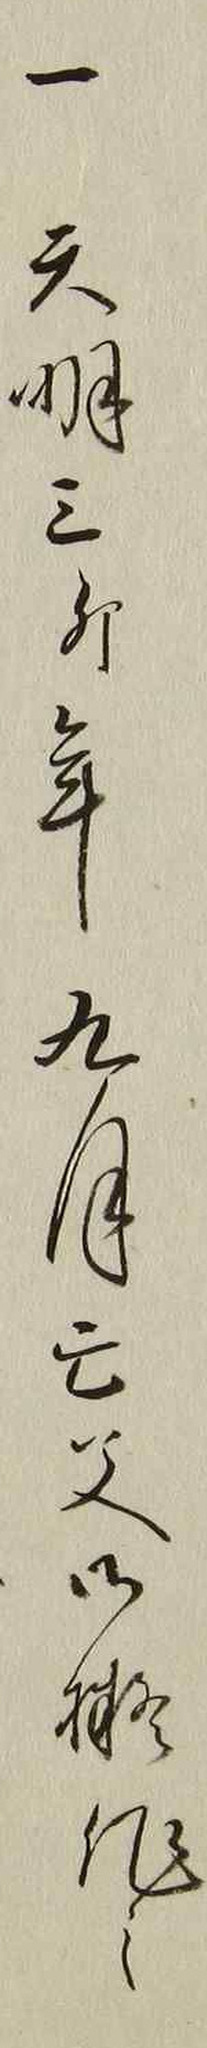一天明三卯年九月亡父御擬作之
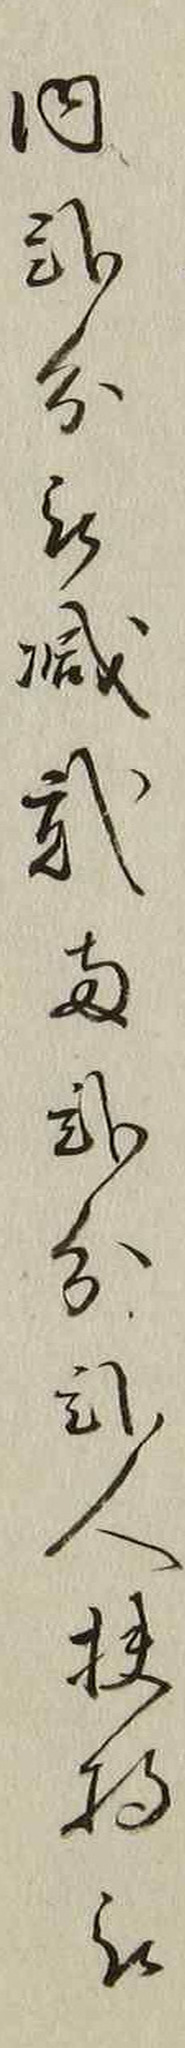内弐分被減弐両弐分弐人扶持被
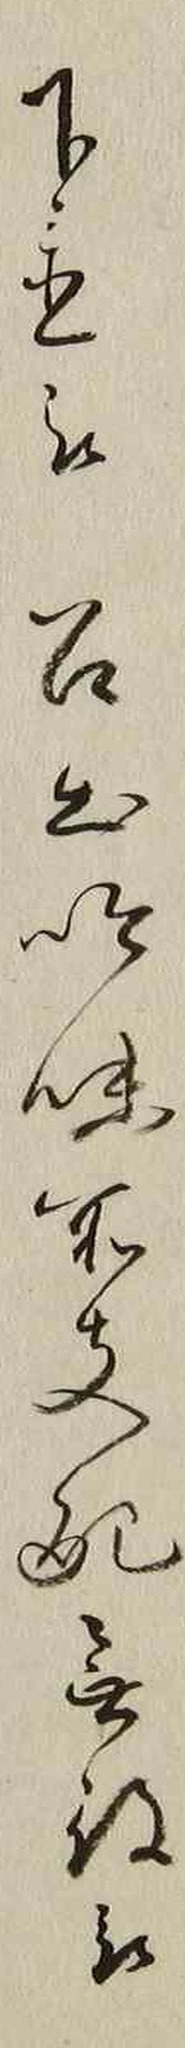下置被召出吟味所支配無役被
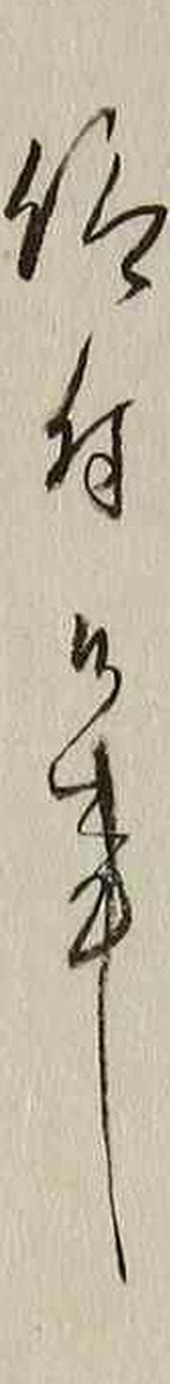仰付候事
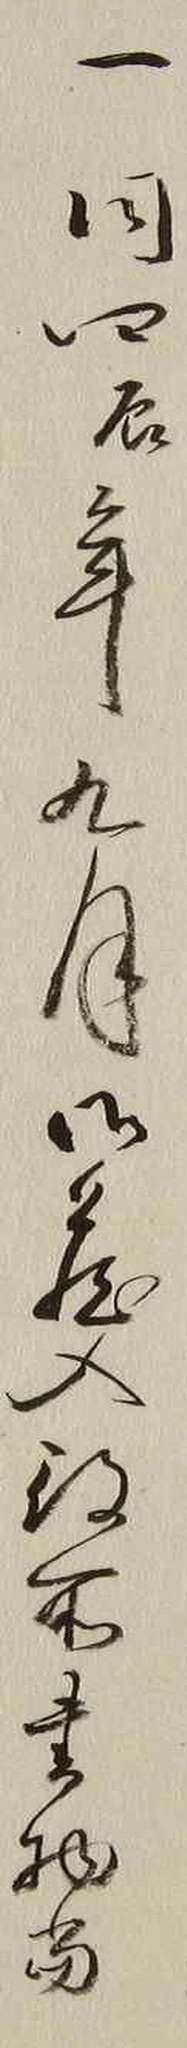一同四辰年九月御蔵入役所書物当
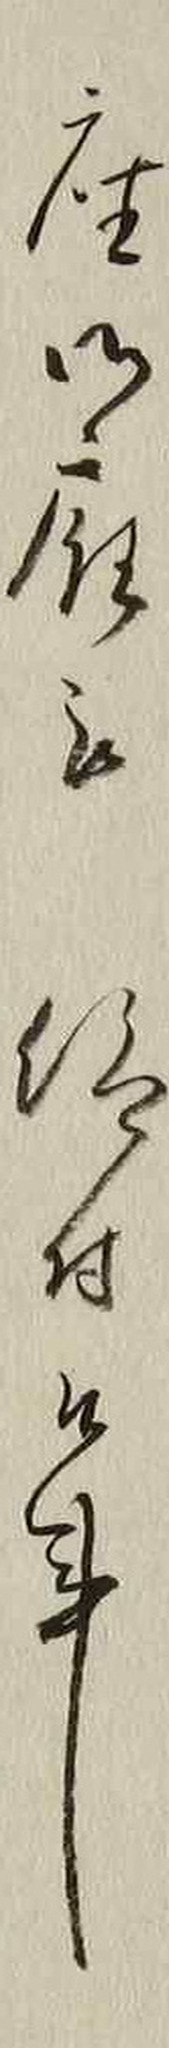座御雇被仰付候事
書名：諸士系譜　巻之10　い之部10
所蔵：会津若松市立会津図書館
